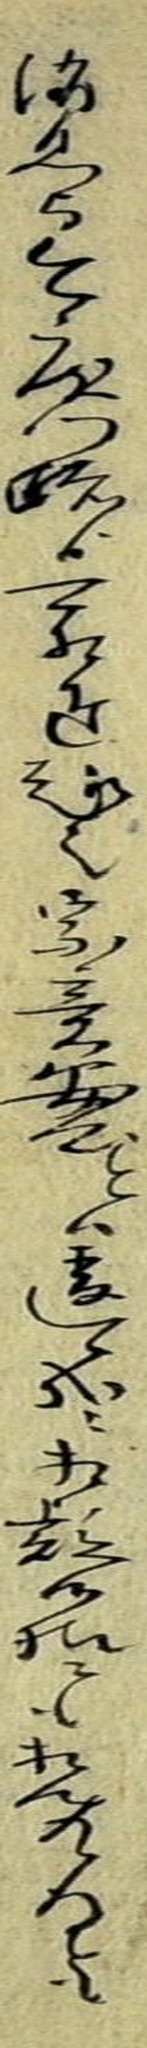消息と今度門跡ゟ可相達趣之宗意安心とは違候哉に相疑候様にも相聞候得とも
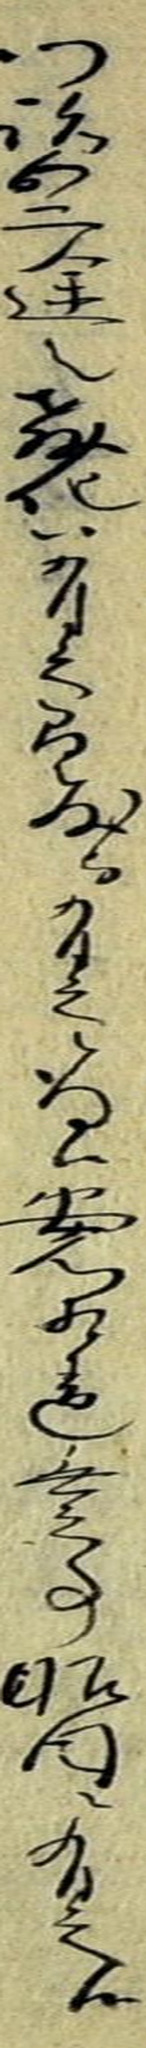門跡ゟ二途之教化は有之間敷と有之候得は安心相違無之事眼内に有之候
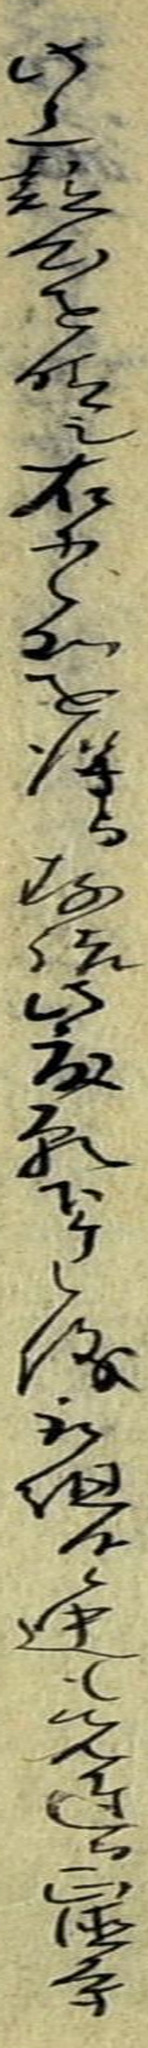此上疑心を晴し右等之処を得と存詰此度願下ヶ之儀取組候に迚も先達而正徳寺
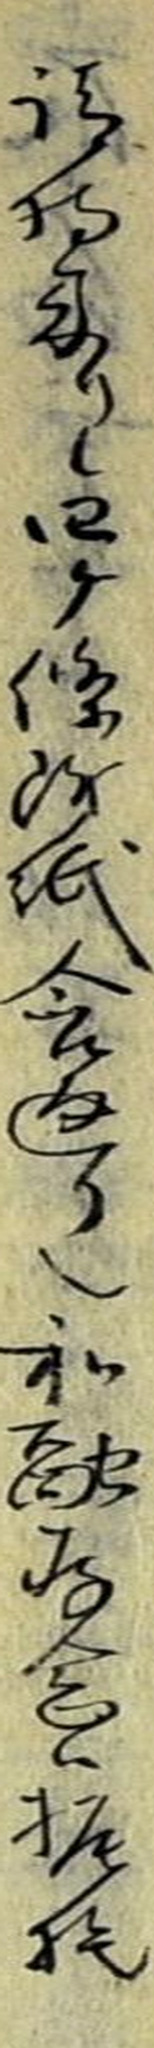請持来り候四ヶ條附紙会廻り之和融存念は握捨
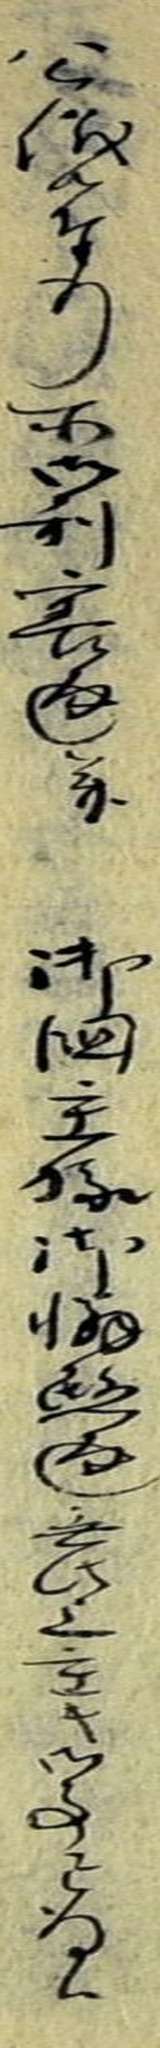公儀御奉行所御利害通并御国主様御憐愍通無此上重キ御事に候得は
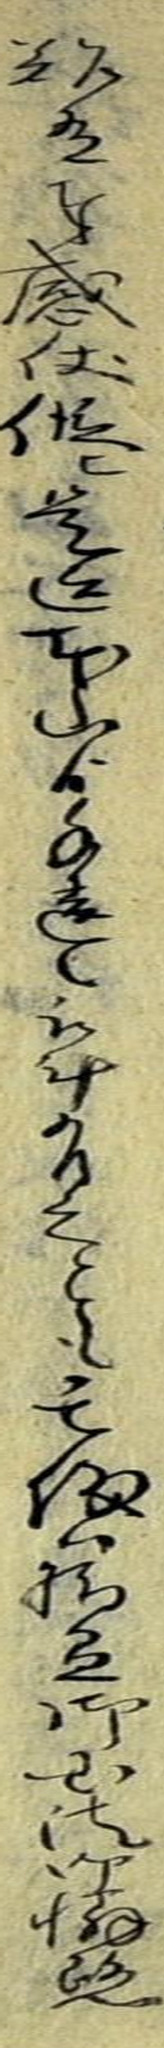難有奉感伏従ひ是迄本山ゟ手違之取斗有之候とも其儀は指置御国法御憐愍
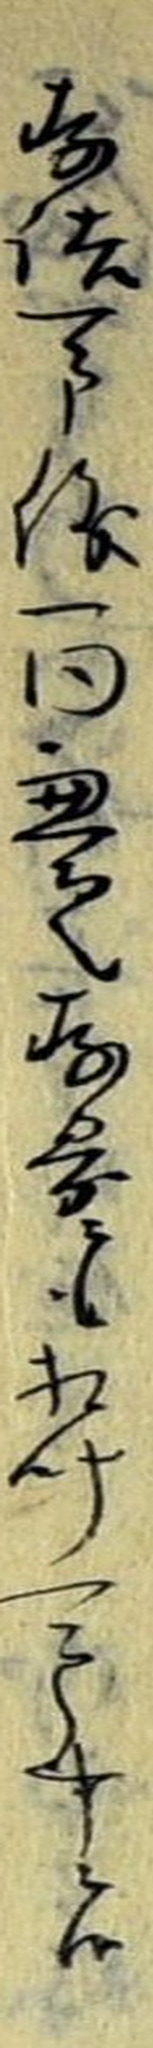存詰可申儀一同兼而之存寄にも相叶可申事に候

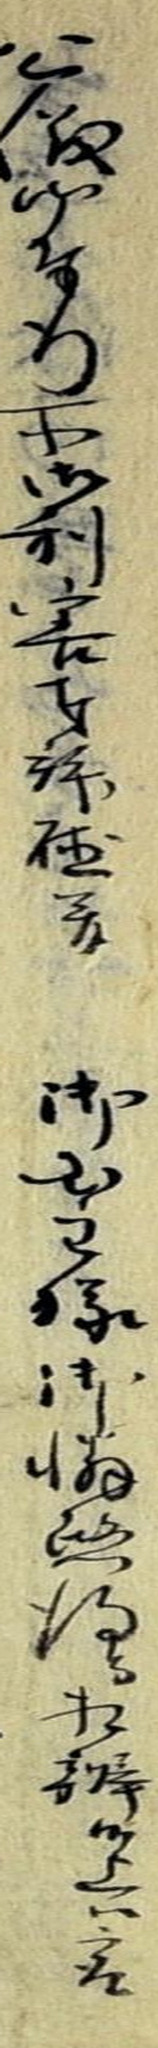公儀御奉行所御利害奉許聴并御国主様御憐愍得と相弁候上は最
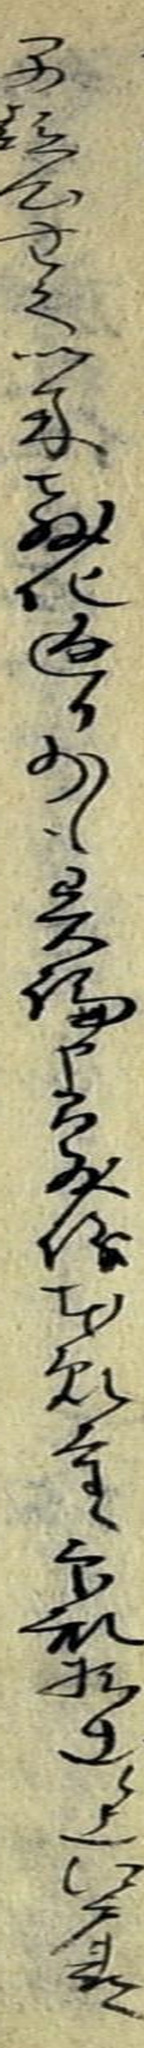早疑心無之以来教化通り少も異論申間敷儀本願寺へ印形指出候上江戸表へ
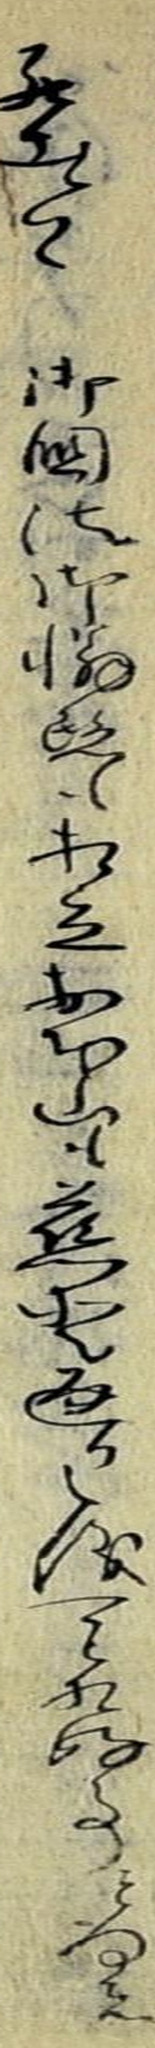罷出候はヽ御国法御憐愍も相立於本山も慈悲通り之儀可被相好事に候得は
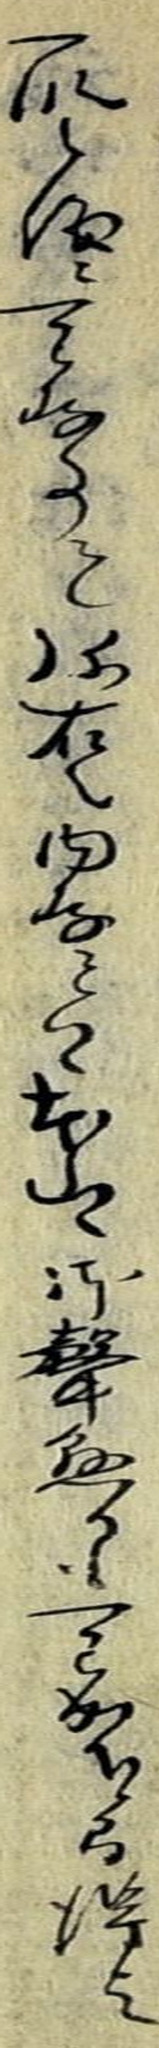一段之儀に可被存事に候弥右之内存に候はヽ本山へ御聲懸りも可被成下候間得と
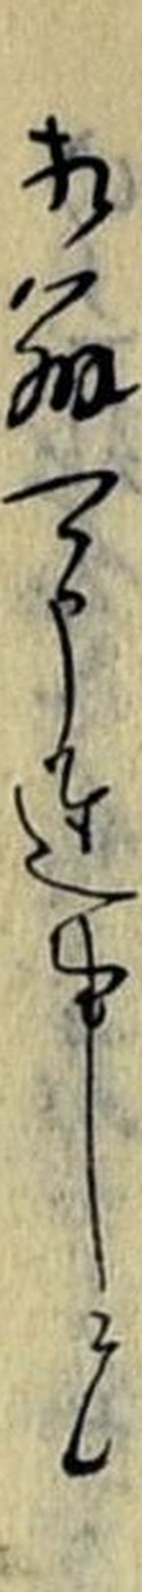相弁可申達事に候
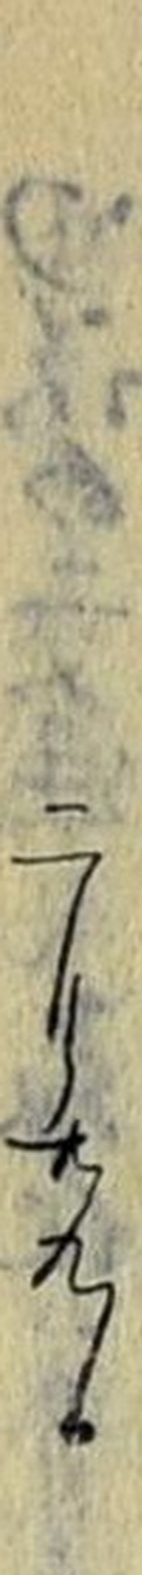二月廿九日
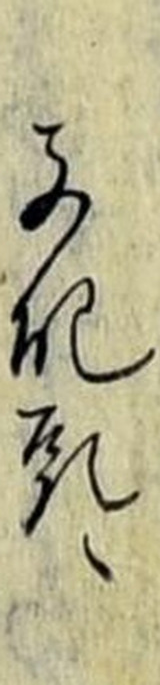支配頭へ
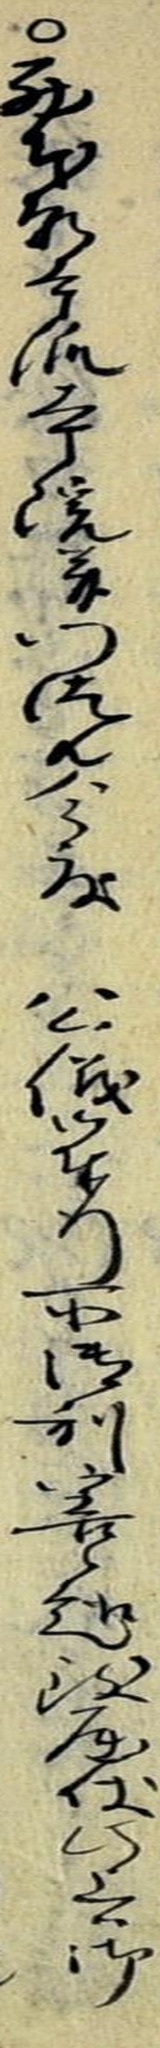○西本願寺派本院并門徒共今度公儀御奉行所御利害之趣致屈伏此上は御
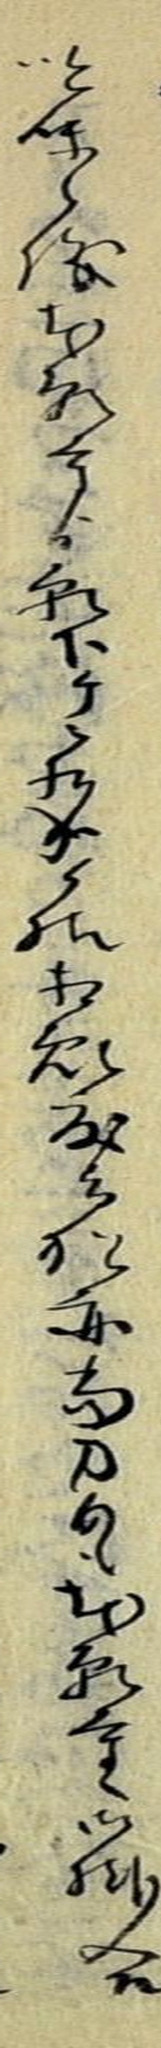吟味之儀本願寺ゟ願下ヶに相成候様相願度旨猶亦当方ゟも本願寺へ御掛合
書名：命令之部 四
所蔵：福井県文書館 Fukui Prefectural Archives
